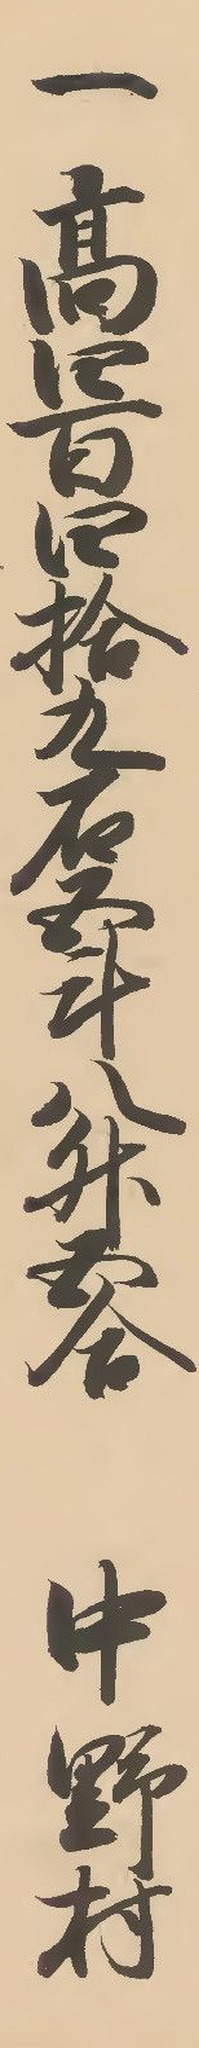一高四百四拾九石五斗八升五合中野村

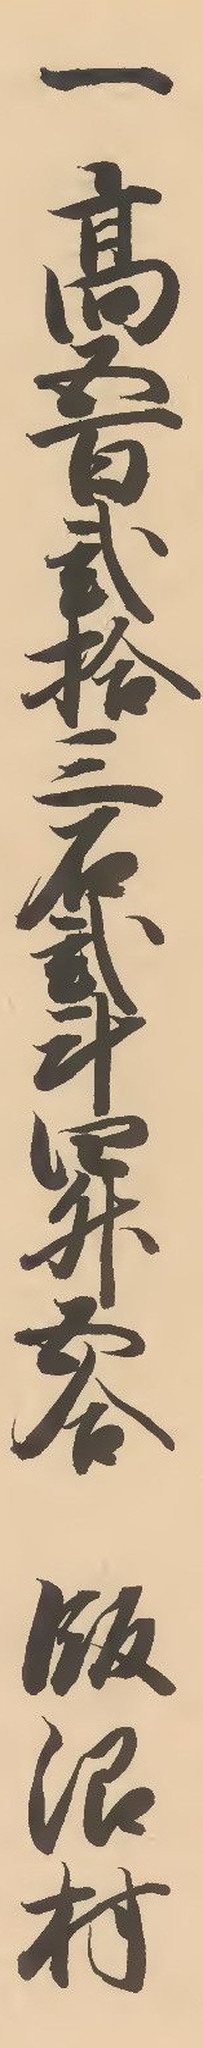一高五百弐拾三石弐斗四升五合飯沼村
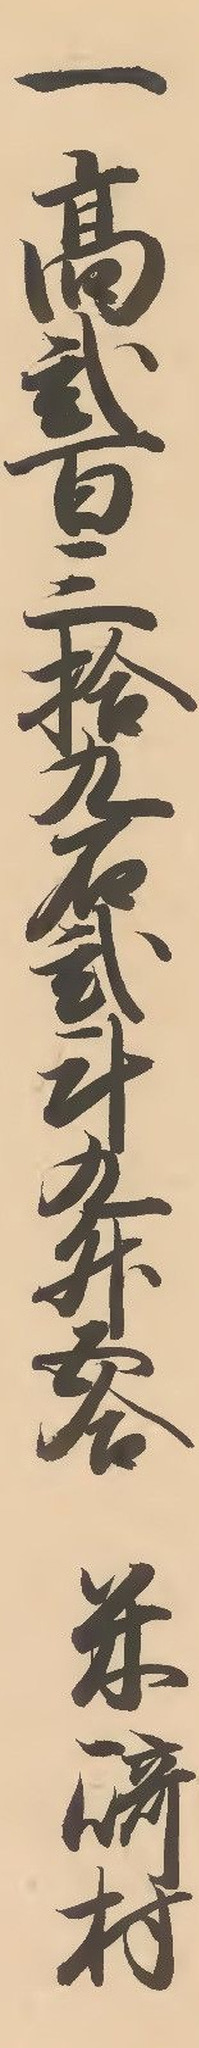一高弐百三拾九石弐斗九升五合米崎村
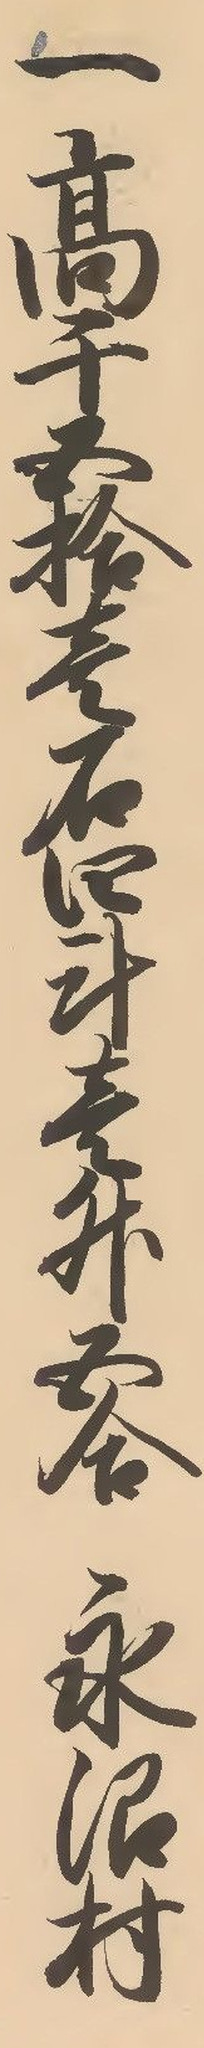一高千五拾壱石四斗壱升五合永沼村
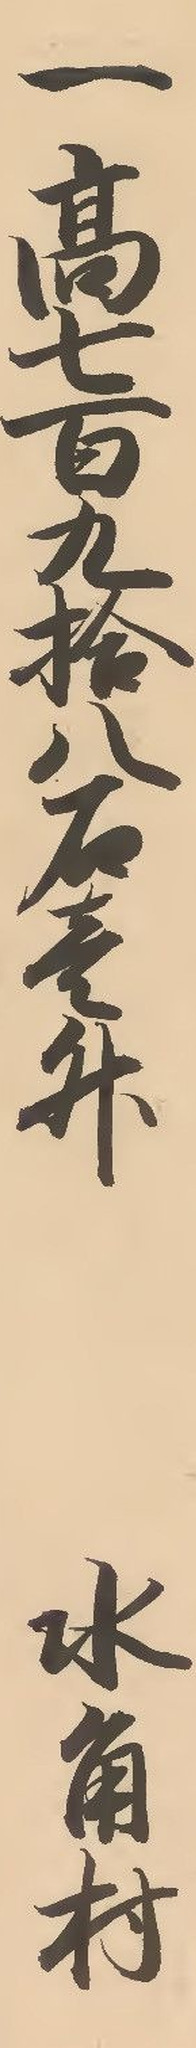一高七百九拾八石壱升水角村
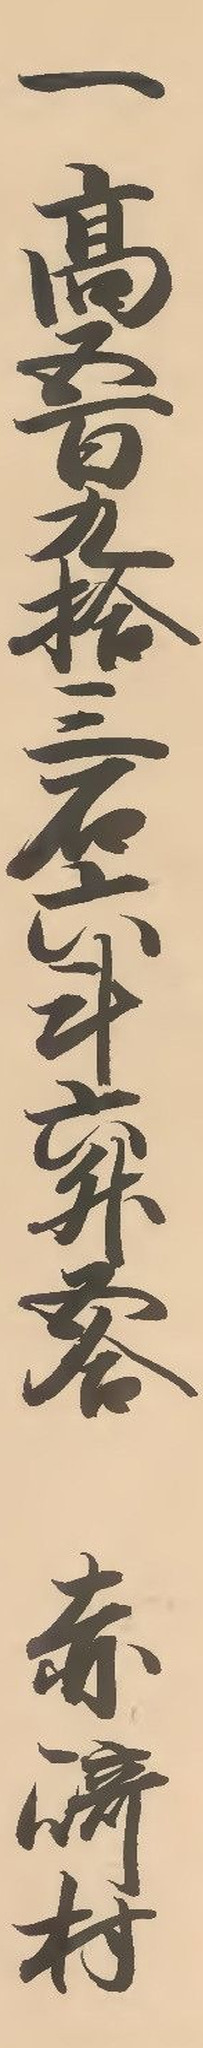一高五百九拾三石六斗六升五合赤崎村
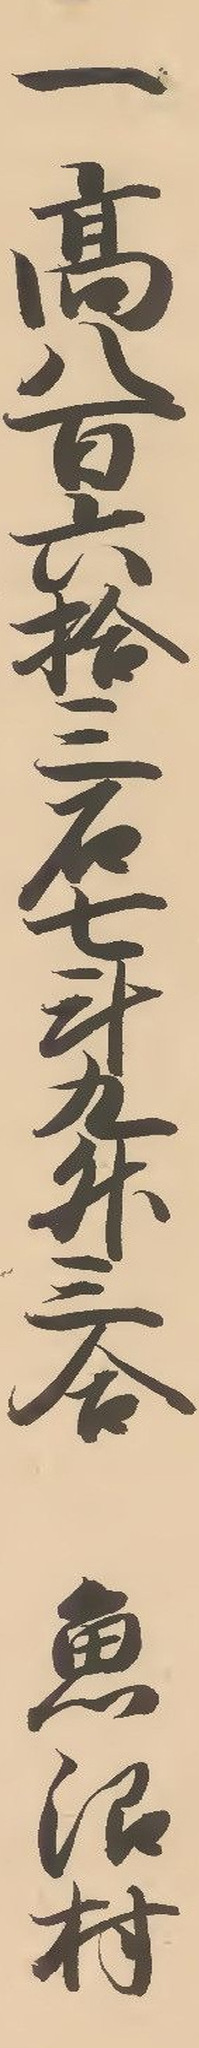一高八百六拾三石七斗九升三合魚沼村
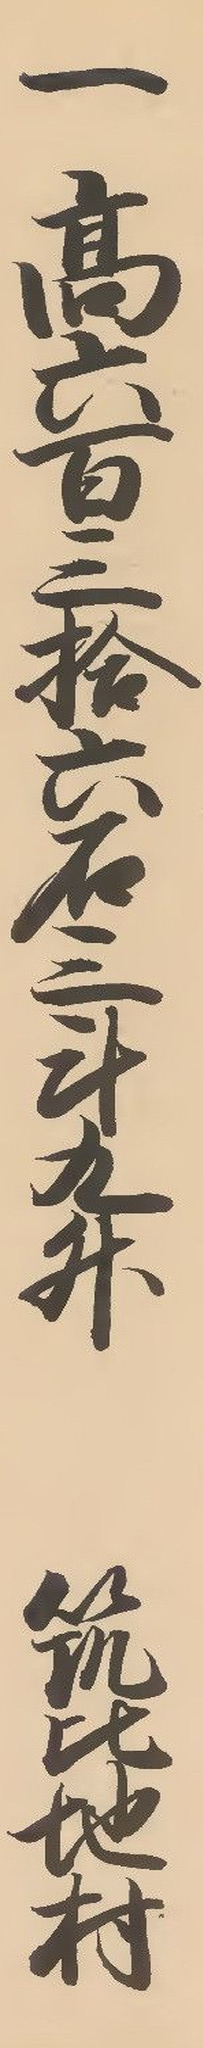一高六百三拾六石三斗九升筑比地村
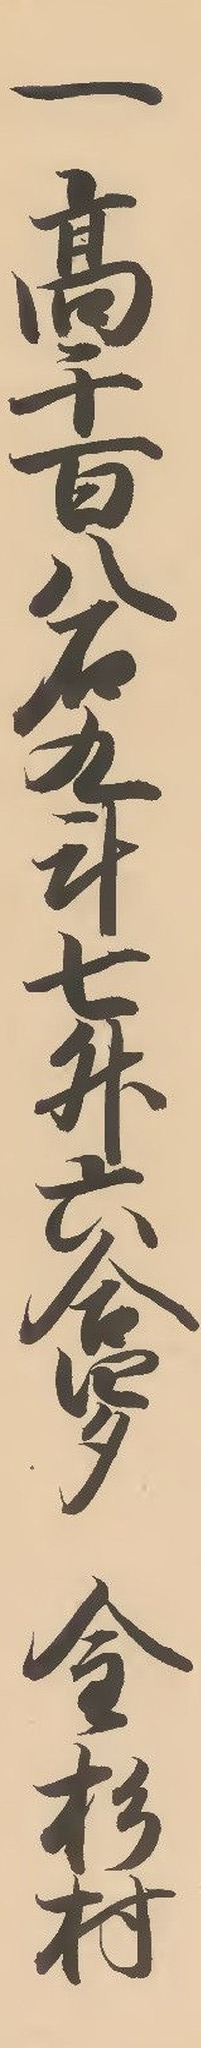一高千百八石九斗七升六合四勺金杉村

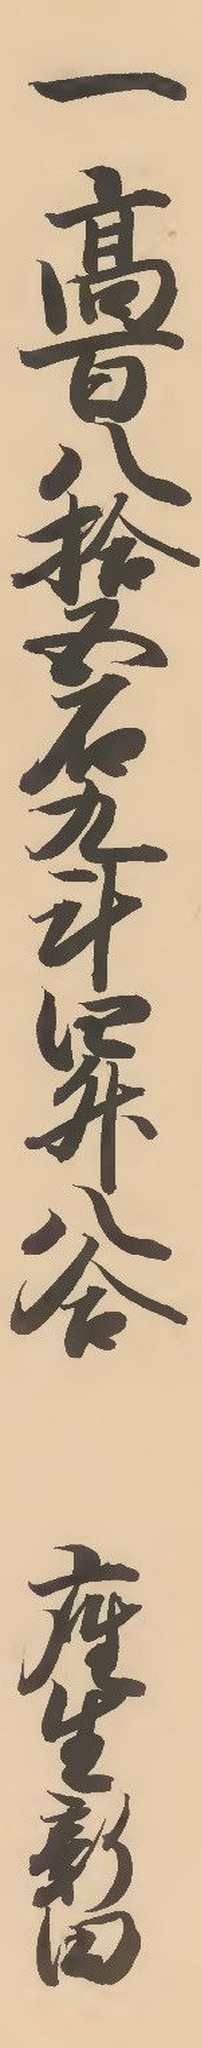一高百八拾五石九斗四升八合座生新田
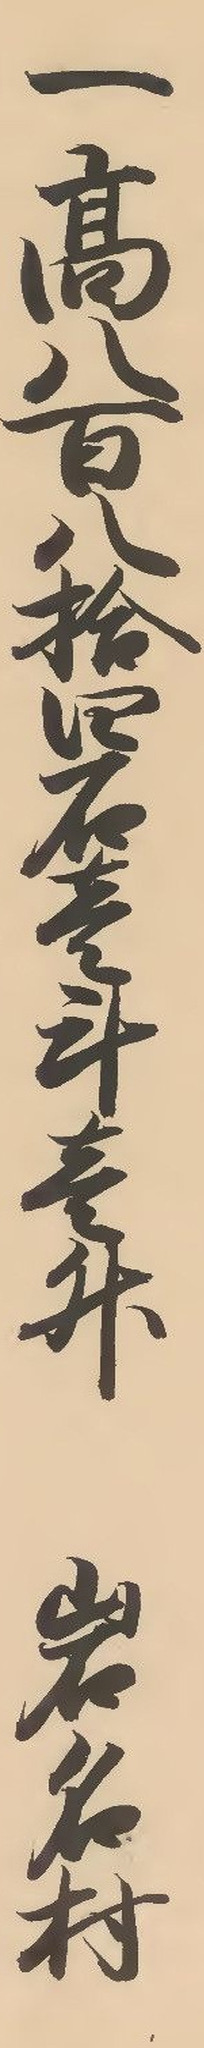一高八百八拾四石壱斗壱升岩名村
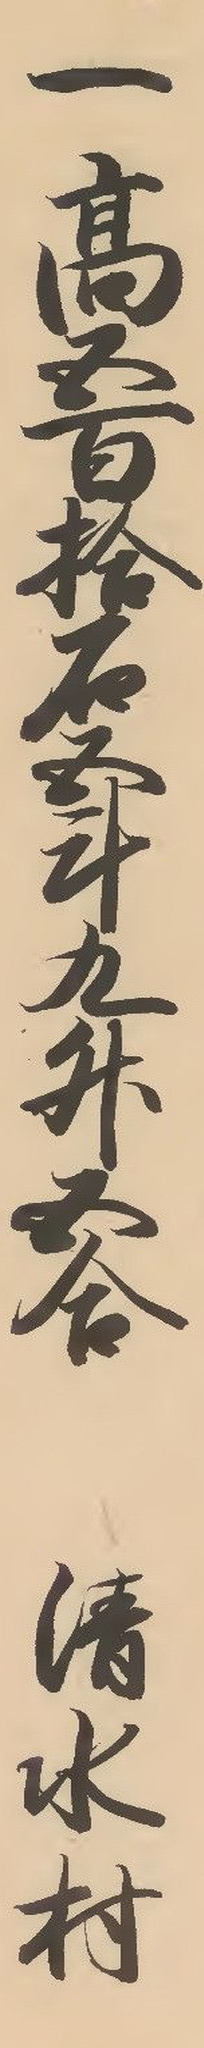一高五百拾石五斗九升五合清水村
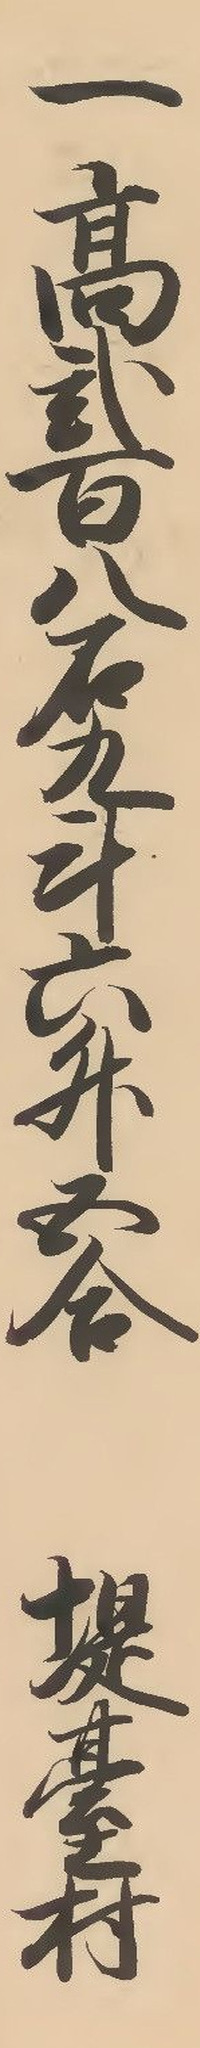一高弐百八石九斗六升五合堤台村
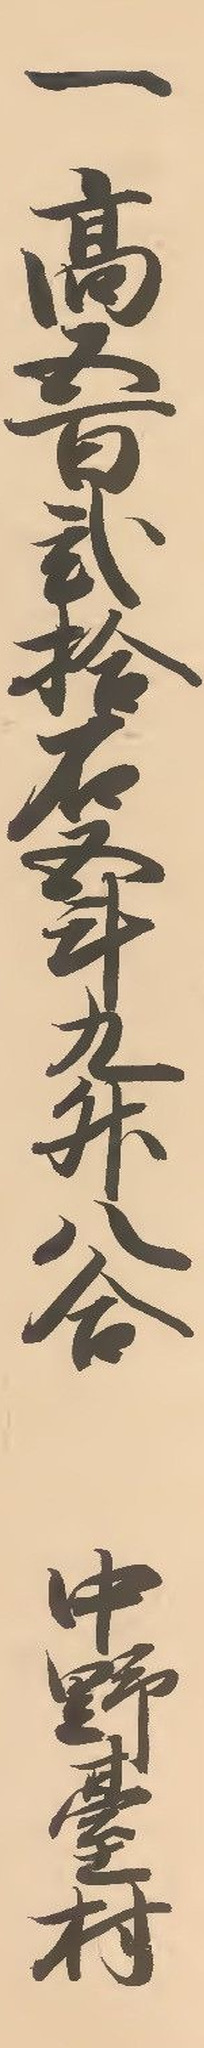一高五百弐拾石五斗九升八合中野台村
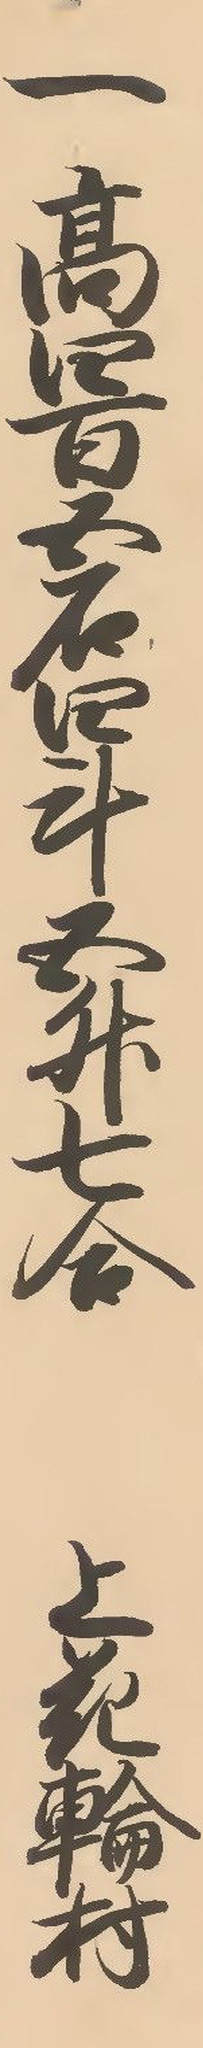一高四百五石四斗五升七合上花輪村
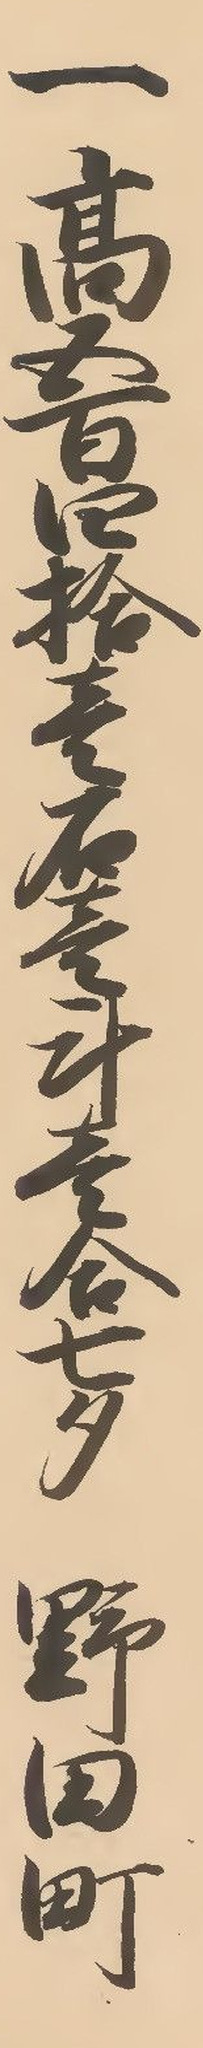一高五百四拾壱石壱斗壱合七勺野田町
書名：下総国郷帳
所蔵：国立公文書館 National Archives of Japan
